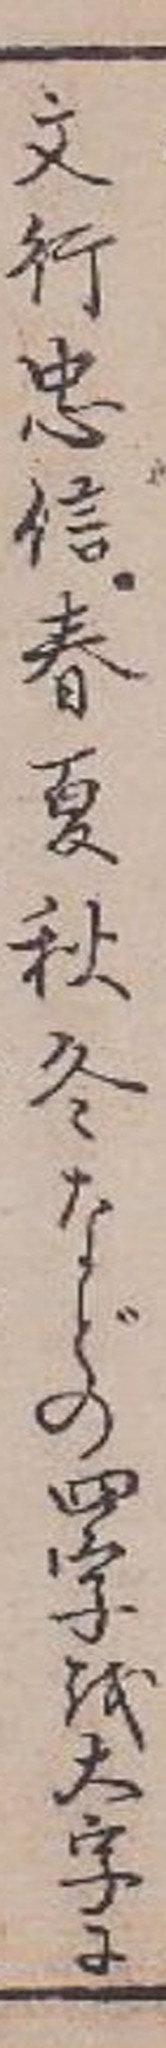文行忠信、春夏秋冬などの四字を大字に
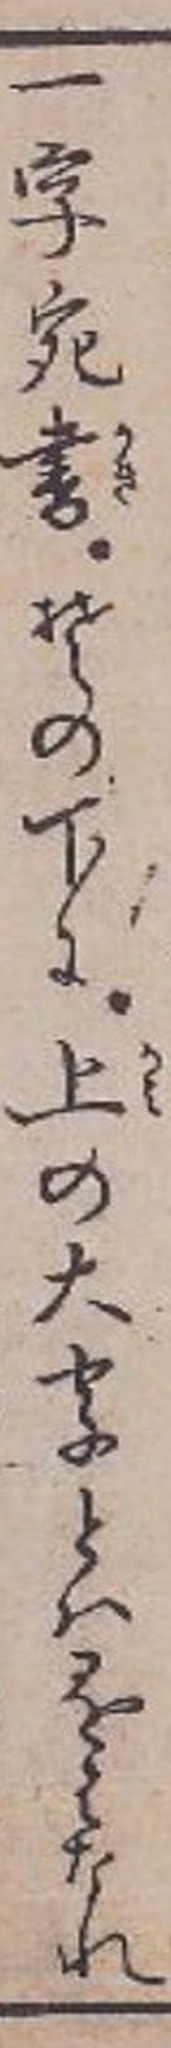一字宛書、その下に、上の大字とは懸はなれ
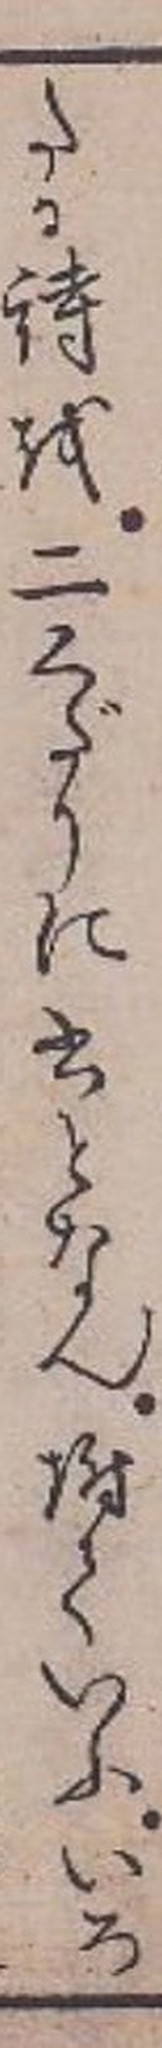たる詩を、二くだりに書となん、附ていふ、いろ
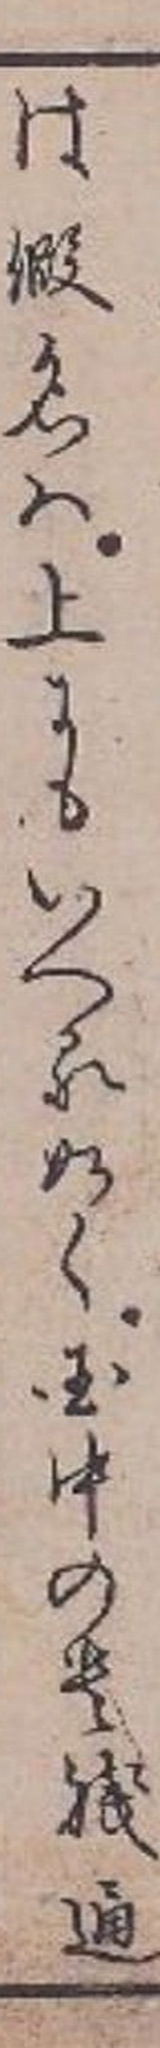は仮名は、上にもいへる如く、国中の貴賤通
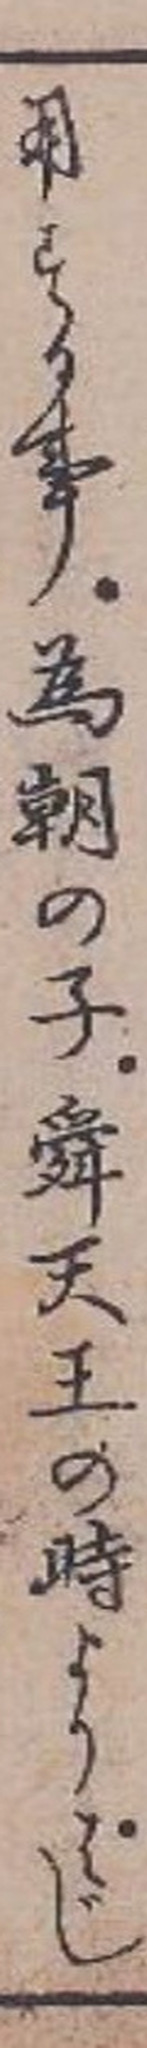用する事、為朝の子、舜天王の時より、はじ
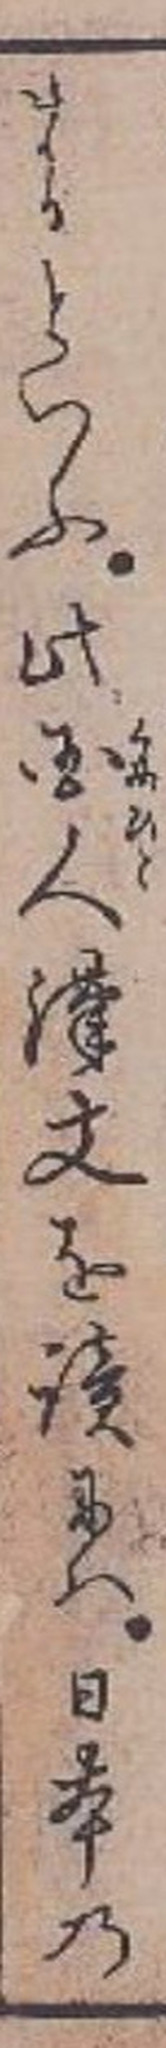まるといふ、此国人漢文を読には、日本の

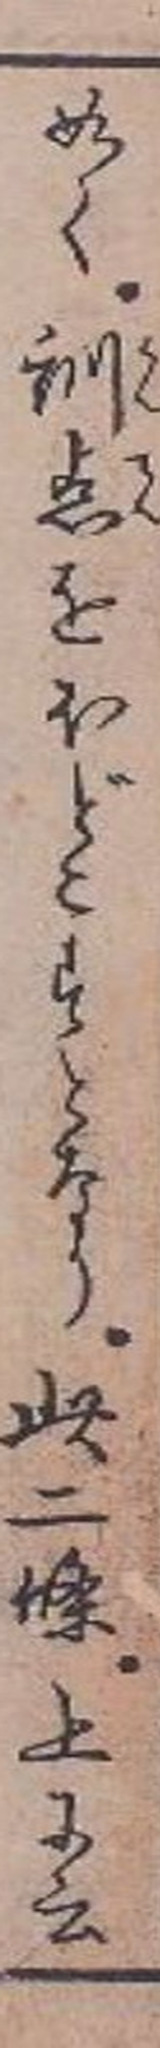如く、訓点をほどこすとなり、此二条、上に云
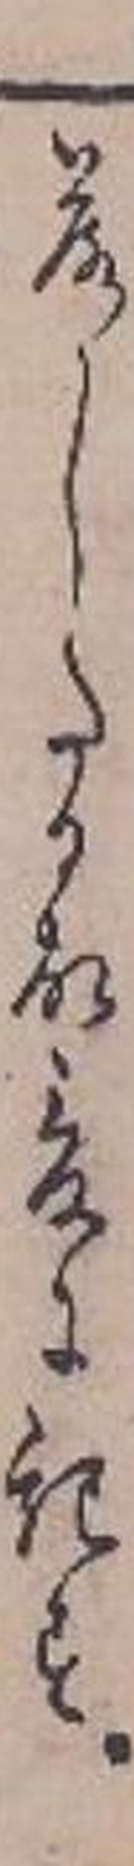落したる故爰に記す、
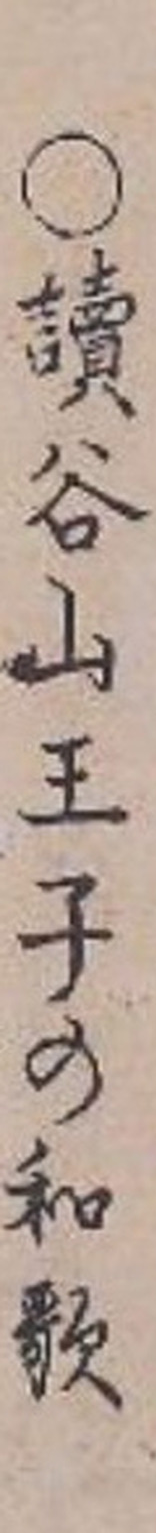○読谷山王子の和歌
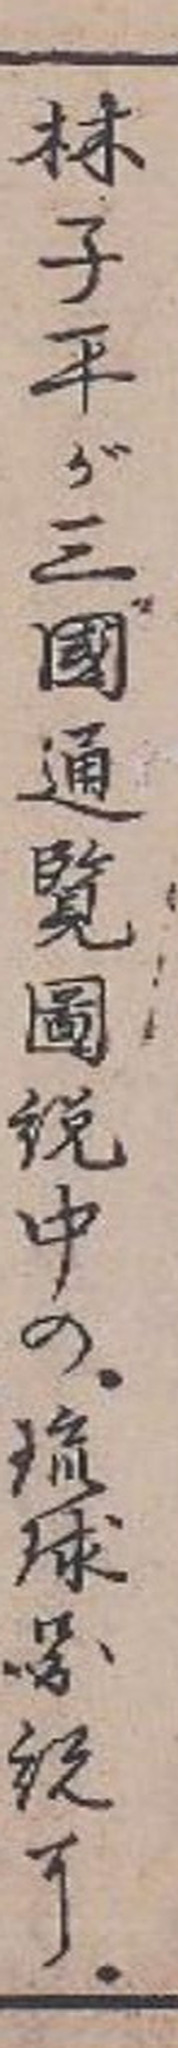林子平が三国通覧図説中の、琉球図説に、
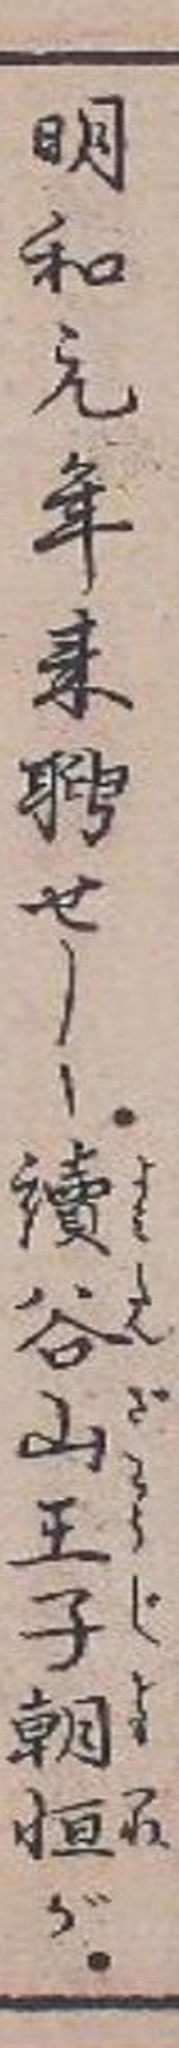明和元年来聘せし、読谷山王子朝恒が、
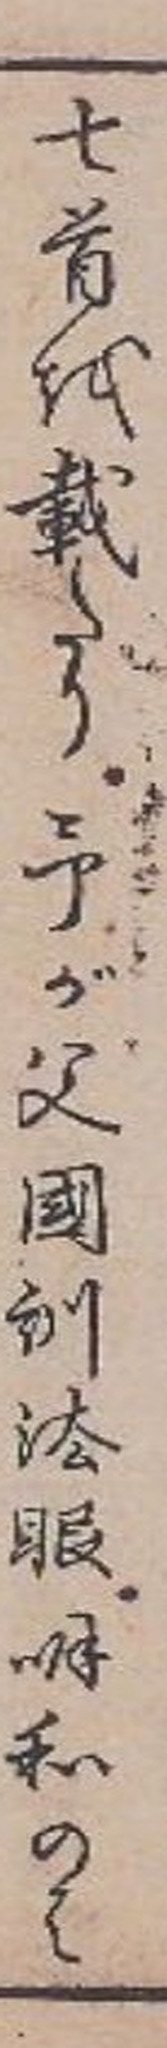七首を載たり、予が父国訓法眼、明和のは
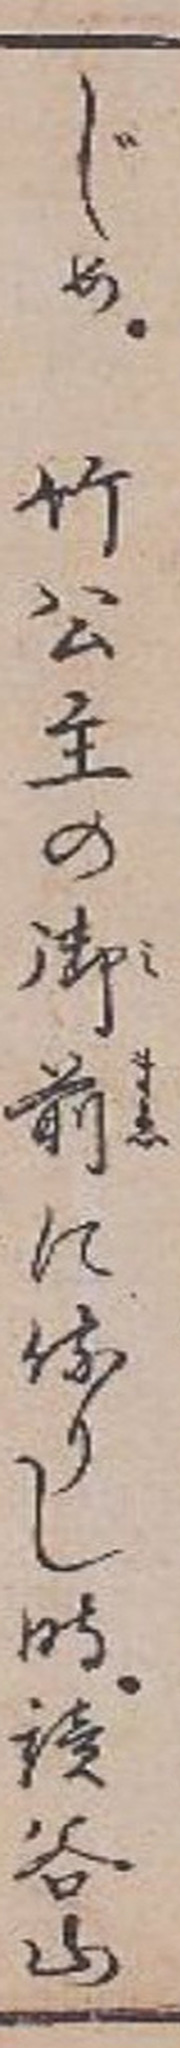じめ、竹公主の御前に侍りし時、読谷山
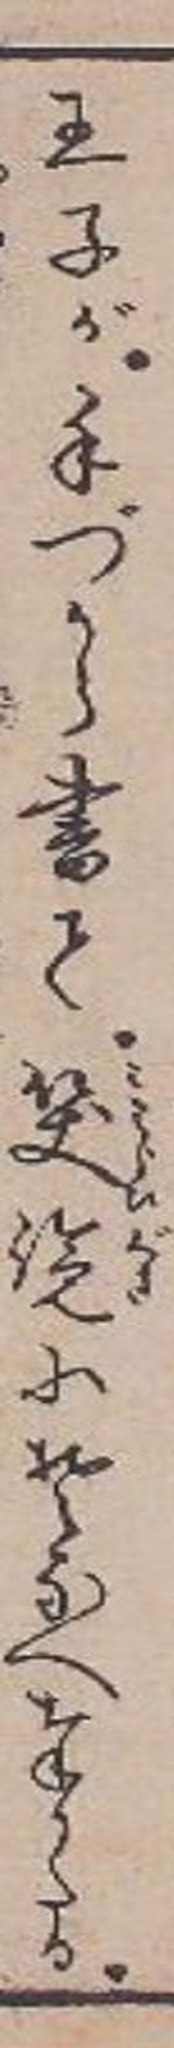王子が、手づから書て、笑覧にそなへ奉りたる、
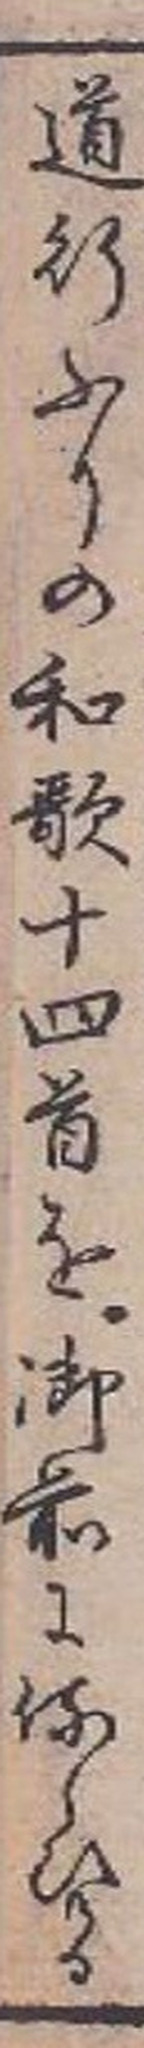道行ふりの和歌十四首を、御前に侍らひける
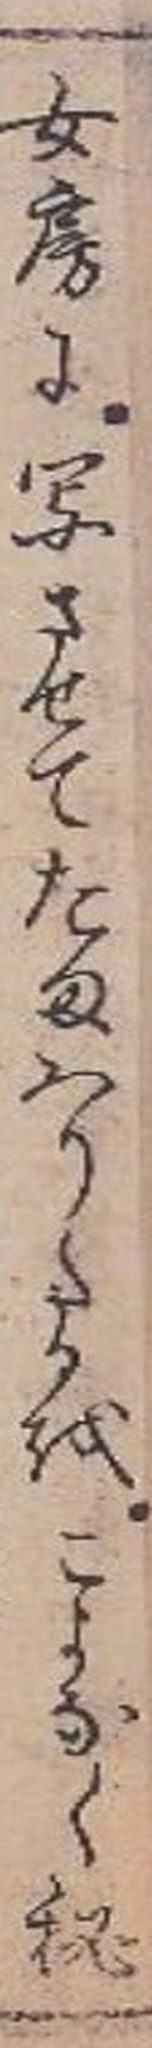女房に、写させてたまはりたるを、こよなく秘
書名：琉球談
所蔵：University of the Ryukyus Library
